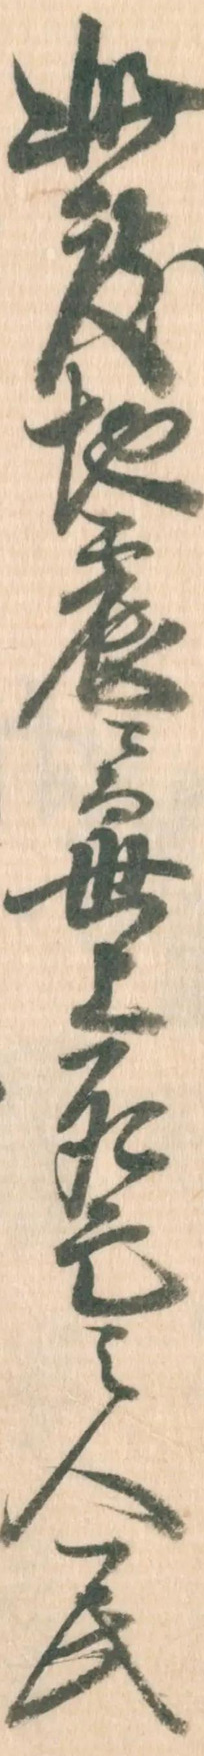此度地震ニて世上死亡之人民
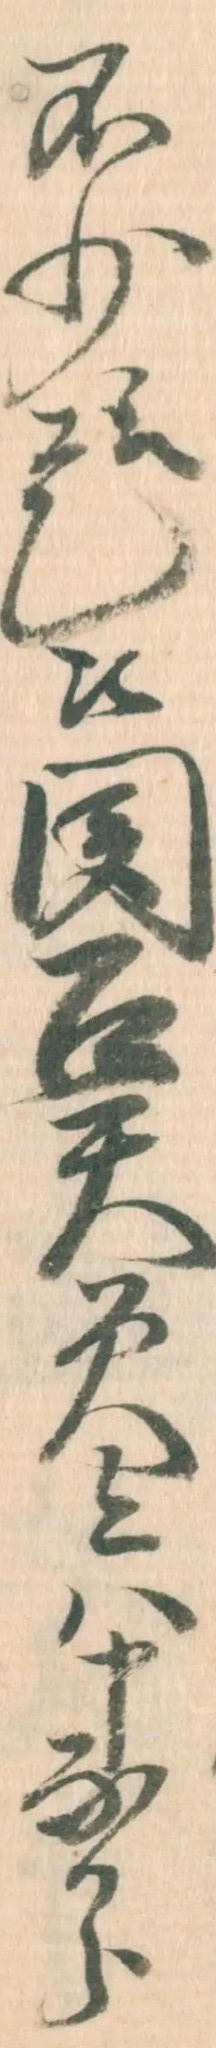不少趣被聞召天災とハ申なから
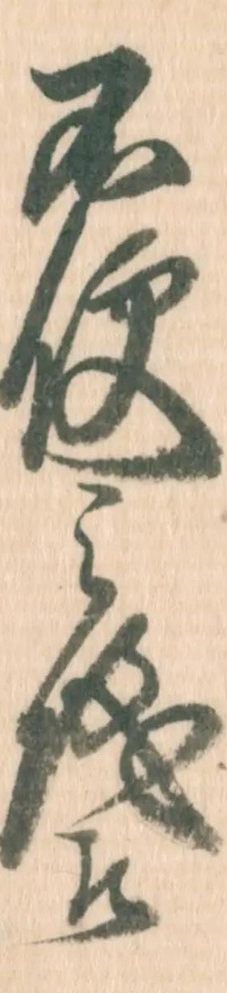不便之儀被
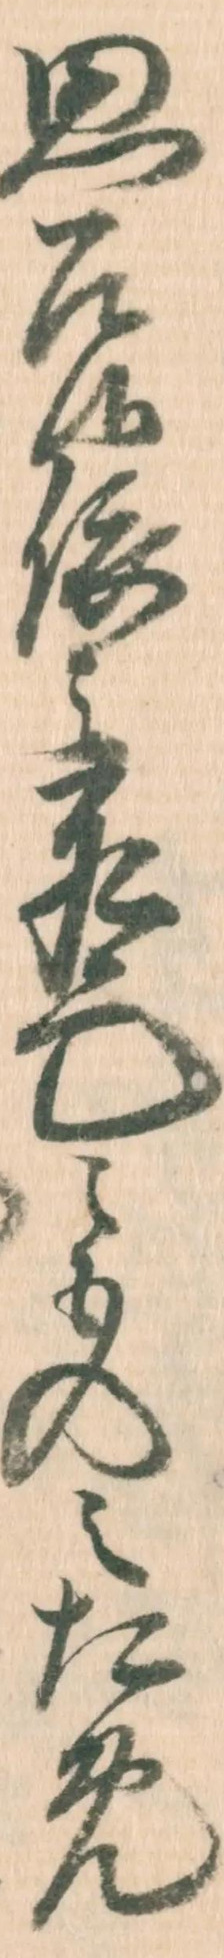思召候依は死亡之もの之ため
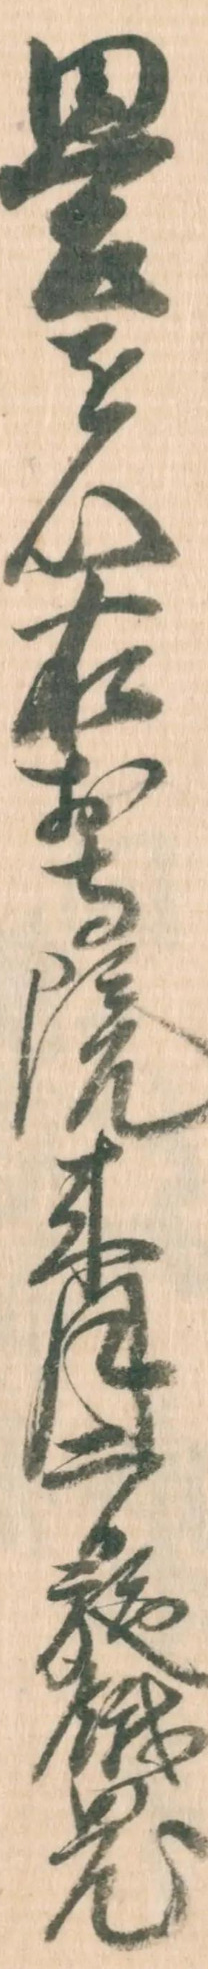思召を以右於寺院来月二日施餓鬼
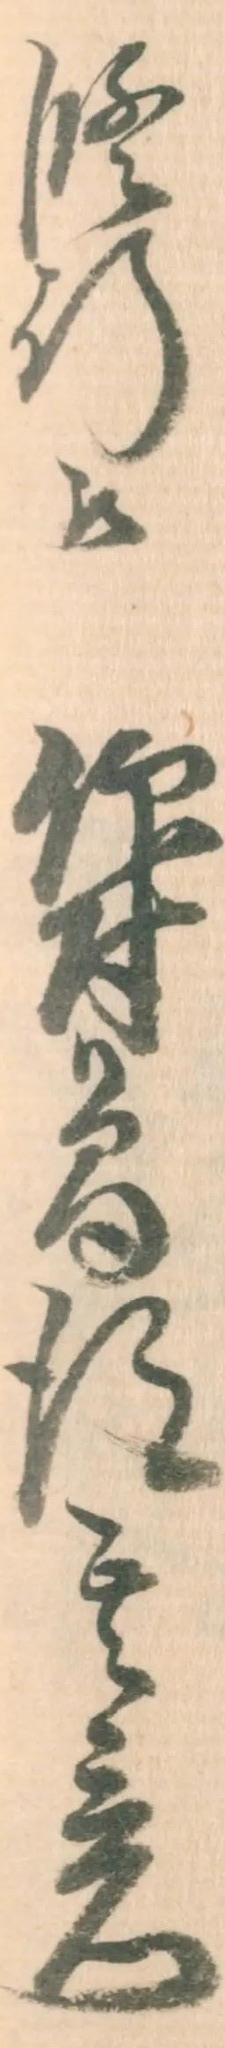修行被仰付候間得其意
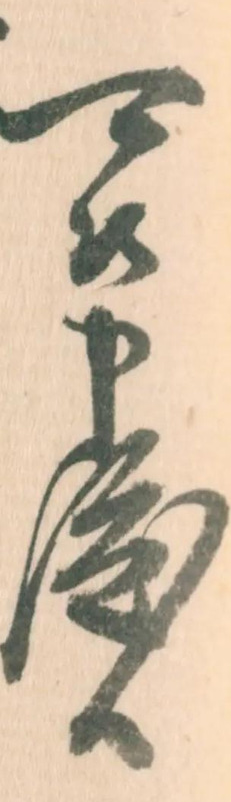可被申渡候
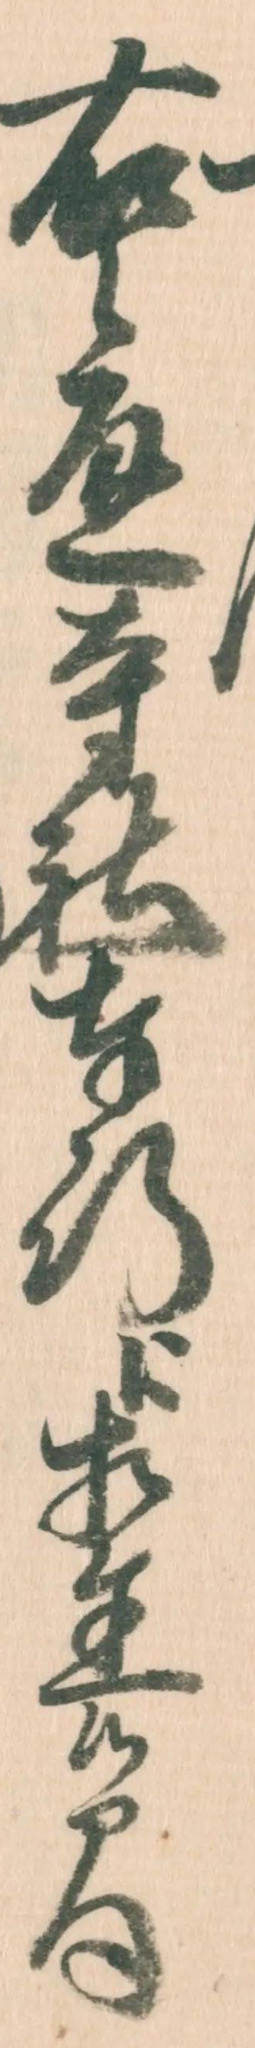右之通寺社奉行え相達候間
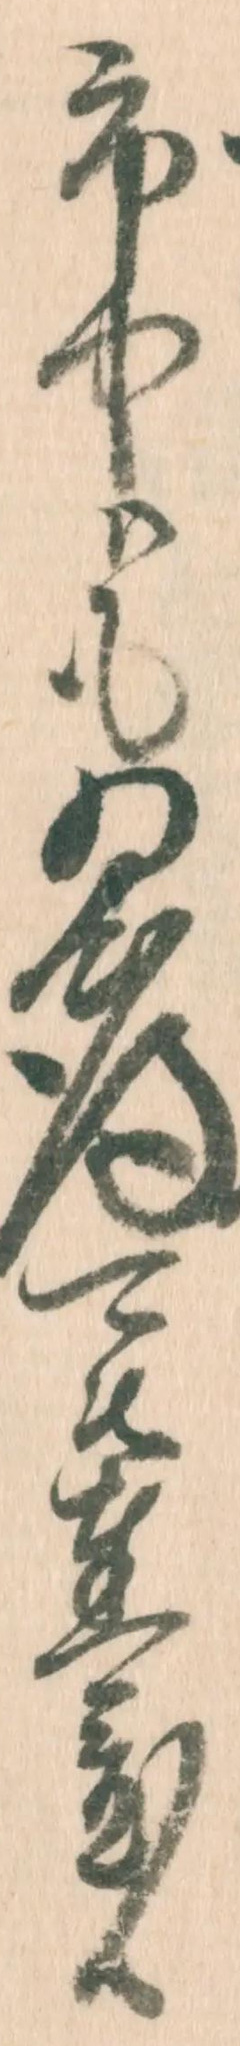市中えも為心得可被達置候

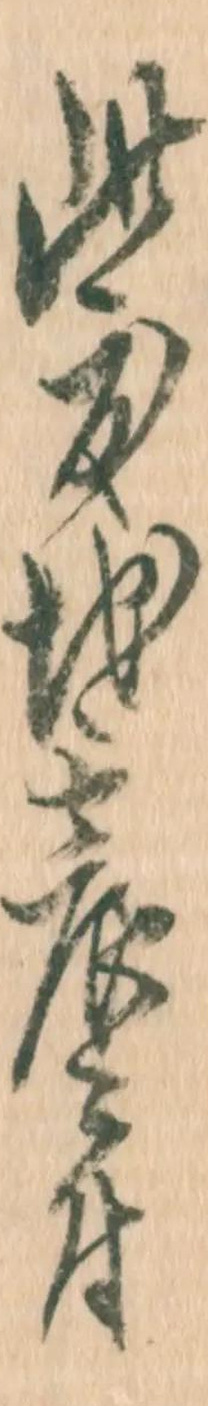此度地震ニ付
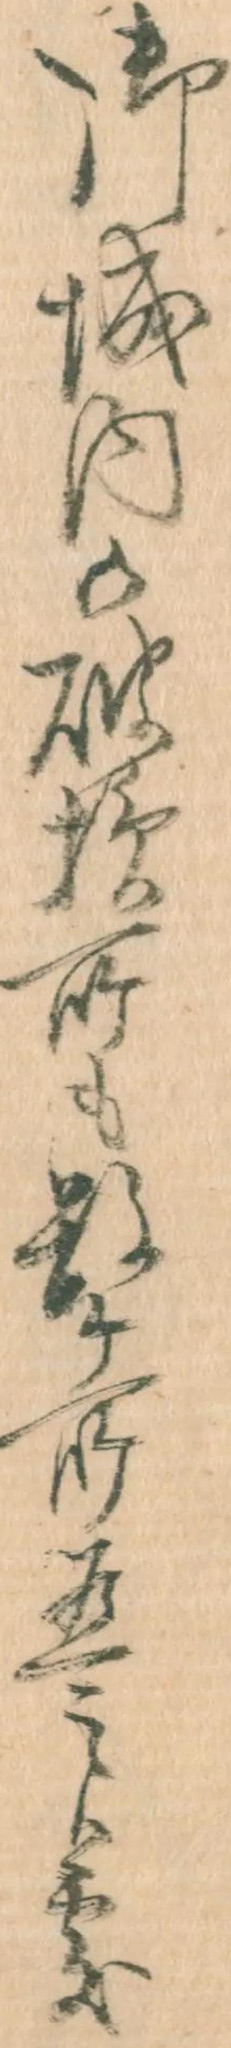御城内御破損所も数ケ所有之候処
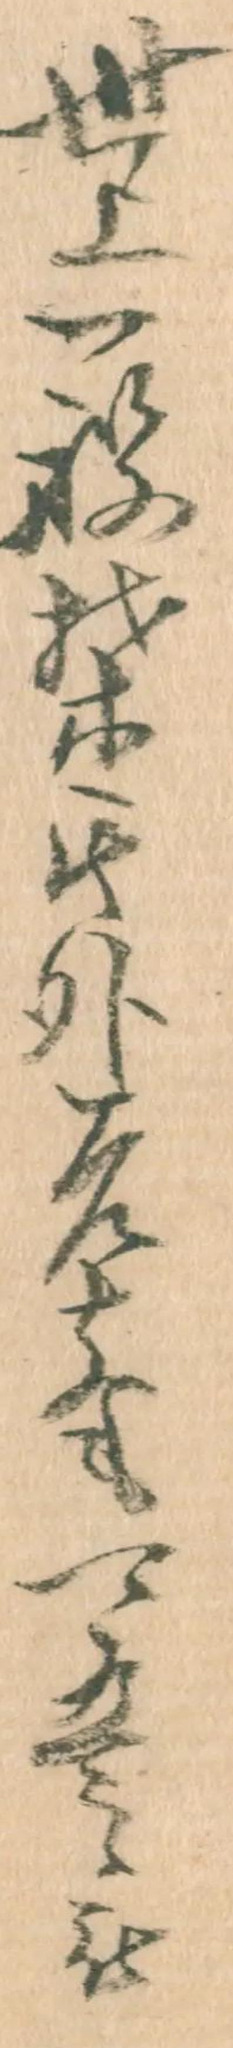世上一般材木其他差支も可有之被

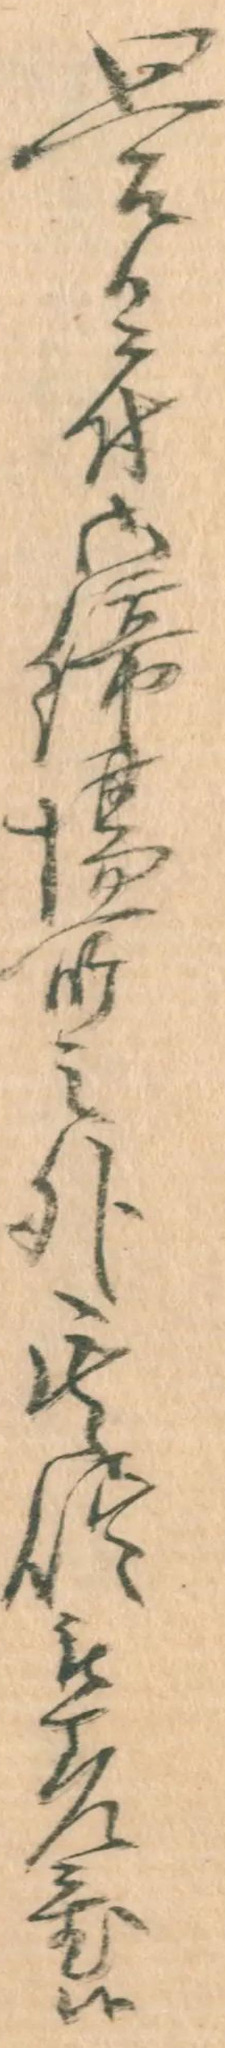思召候ニ付御締場所之外其儘被差置候
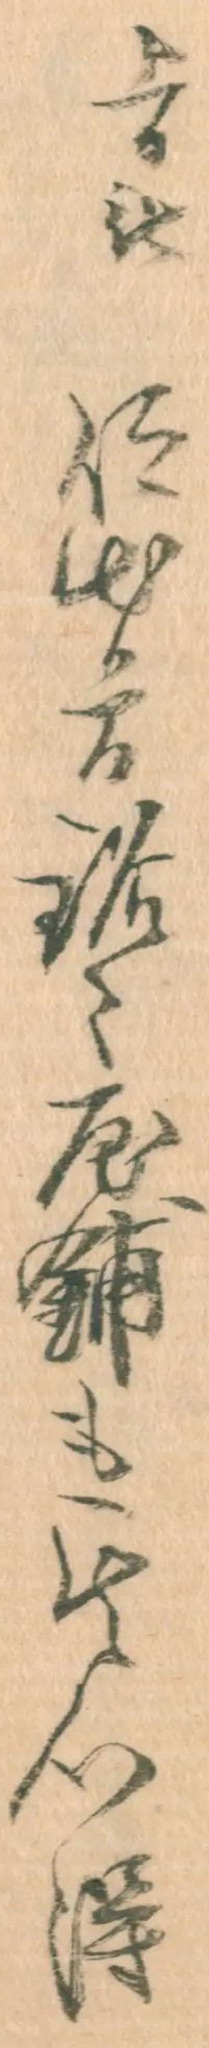旨被仰出候間銘〻屋敷も其心得
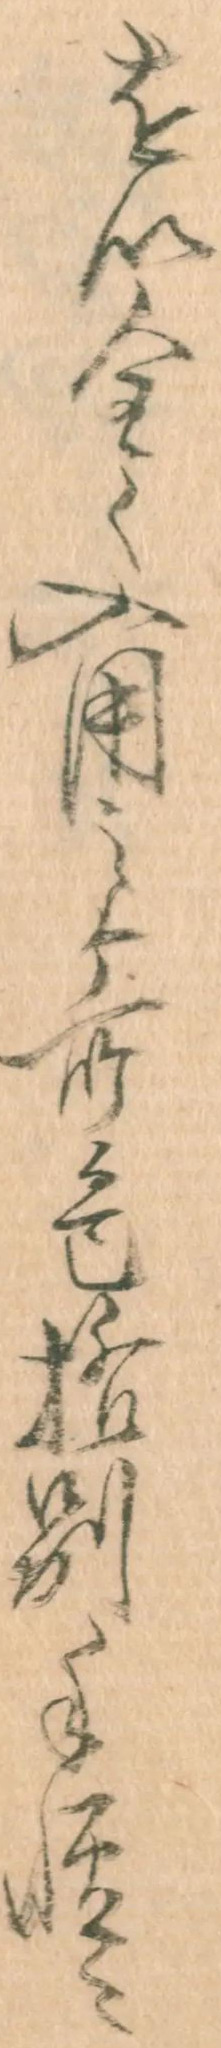を以全く入用之ケ所而已格別手軽ニ
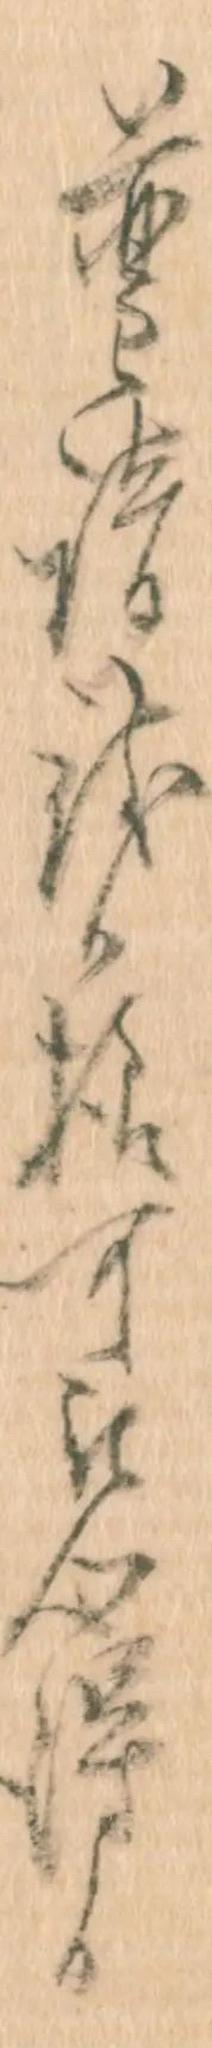普請致候様可被心得候
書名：地震災書留 2巻. [2] 内表紙に「地震一件　安政二卯年十月」とあり
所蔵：国立国会図書館 National Diet Library, JAPAN
